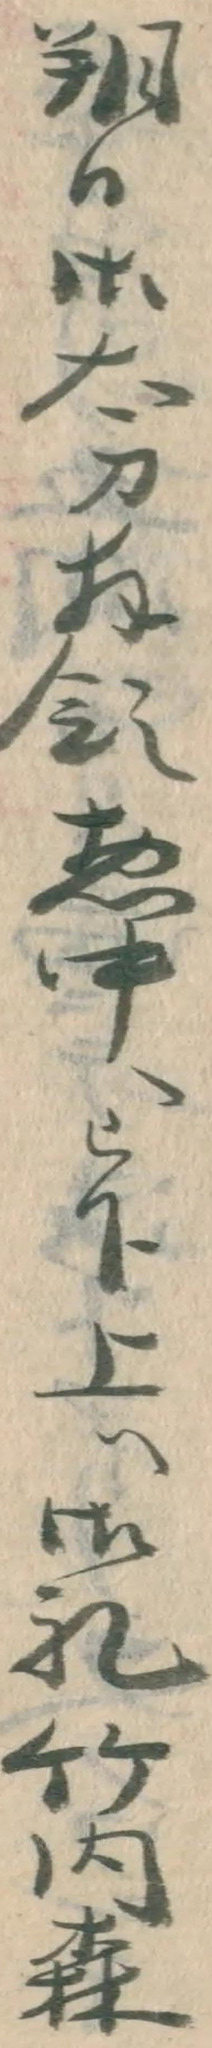朔日御太刀拝領惣中へ被下上ヘ御礼竹内森
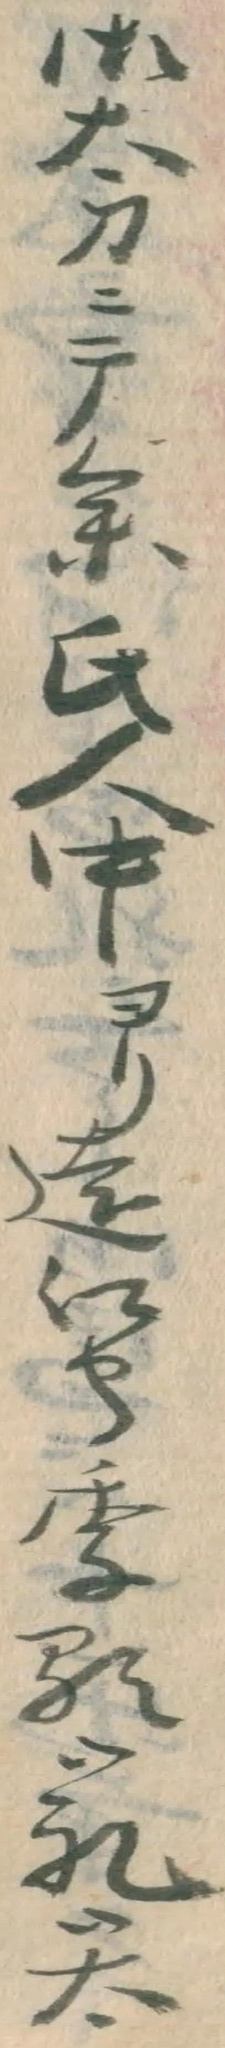御太刀ニテ参氏人中ヨリ遠江守季顕御礼御太

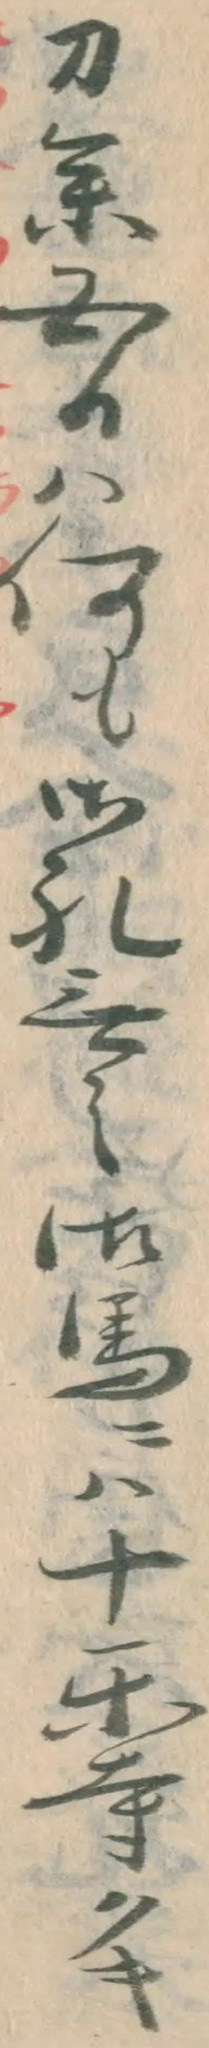刀参五日ハ何も御礼無之御馬ニハ十楽寺クキ
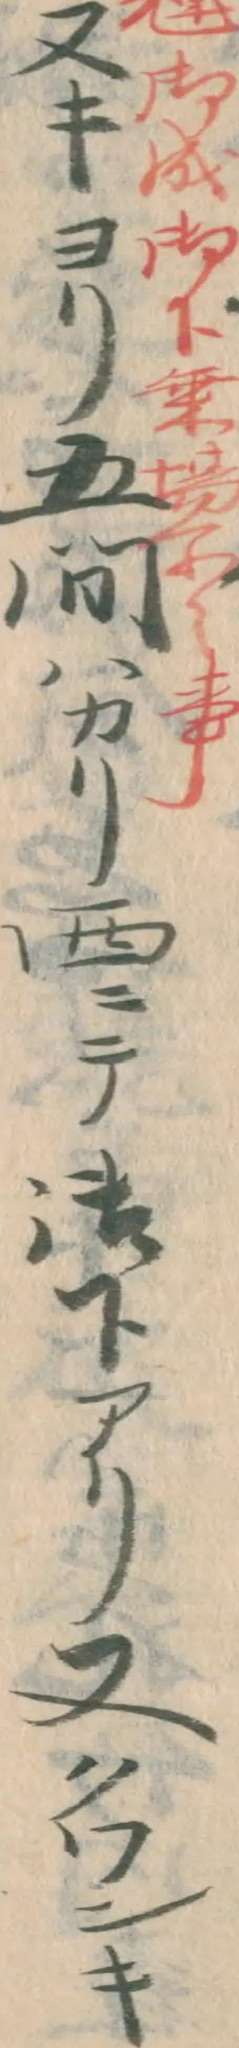ヌキヨリ五間ハカリ西ニテ御下アリ又クワンキ
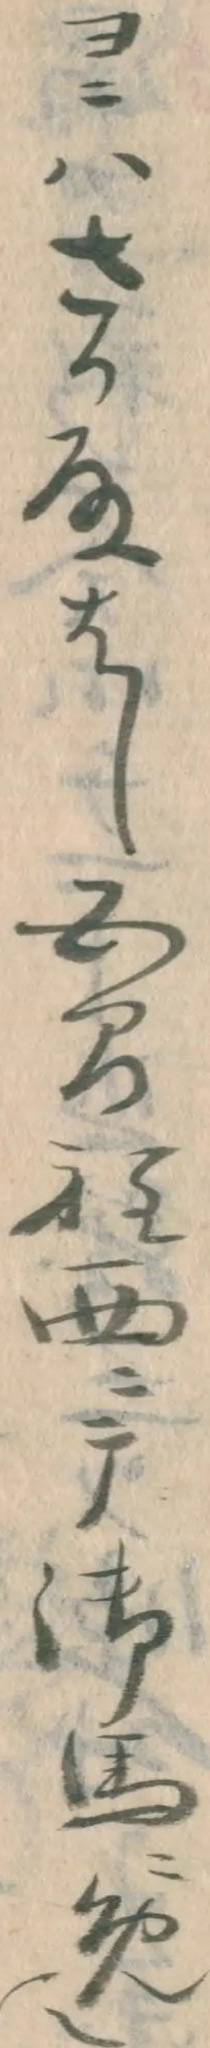ヨニハさか殿はし五間程西ニテ御馬ニめす
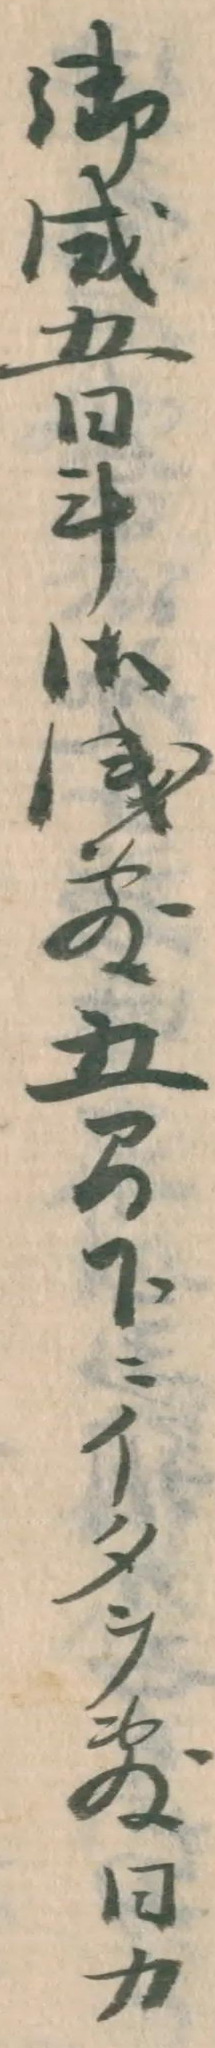御成五日計御桟敷五間下ニイタヲ敷同カ
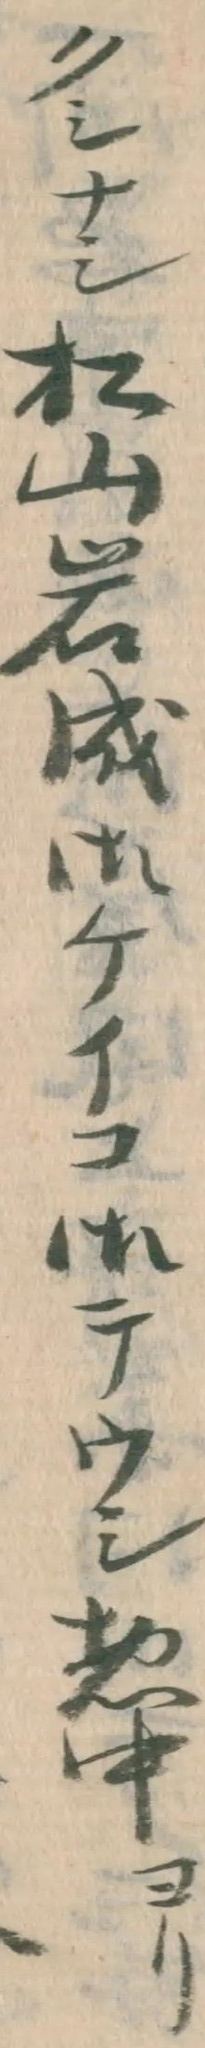クシナシ松山岩成御ケイコ御テウシ惣中ヨリ
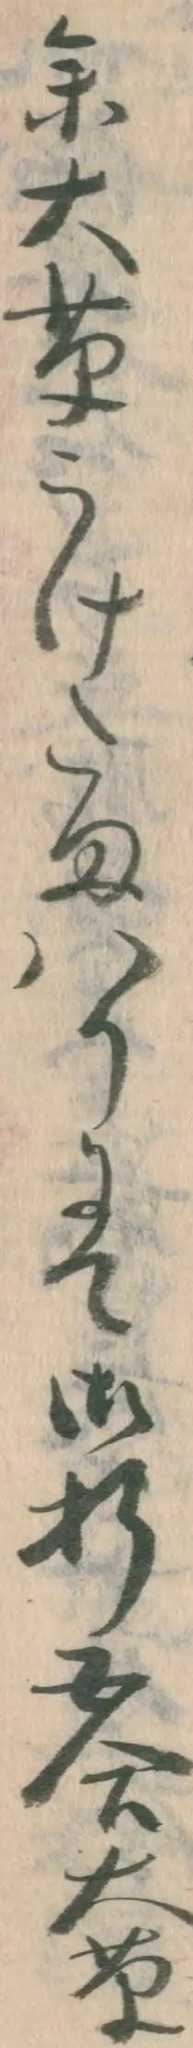参大草うけたまハりにて御折五合大草
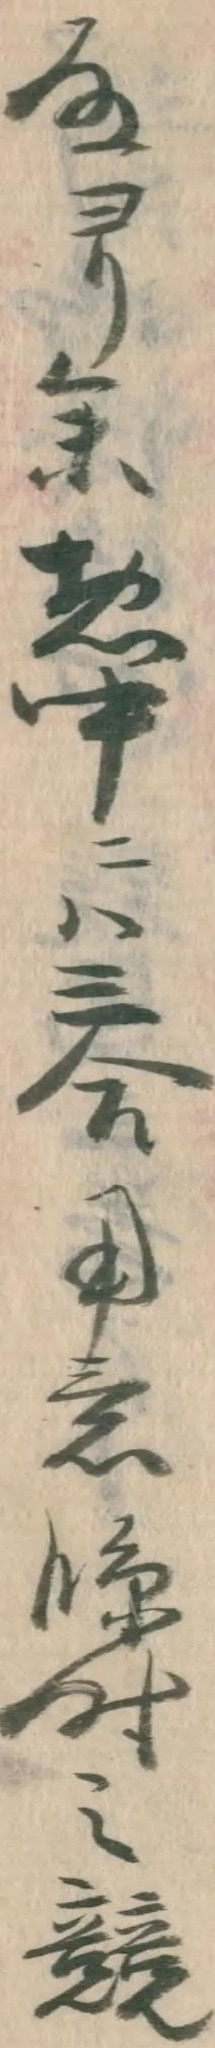殿より参惣中ニハ三合用意臨時之競
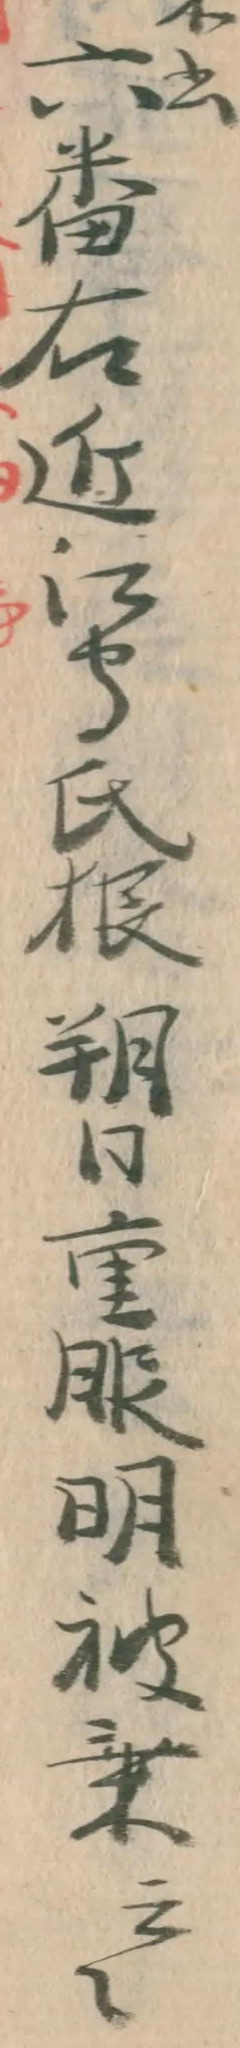六番右近江守氏根朔日重服明被乗云々
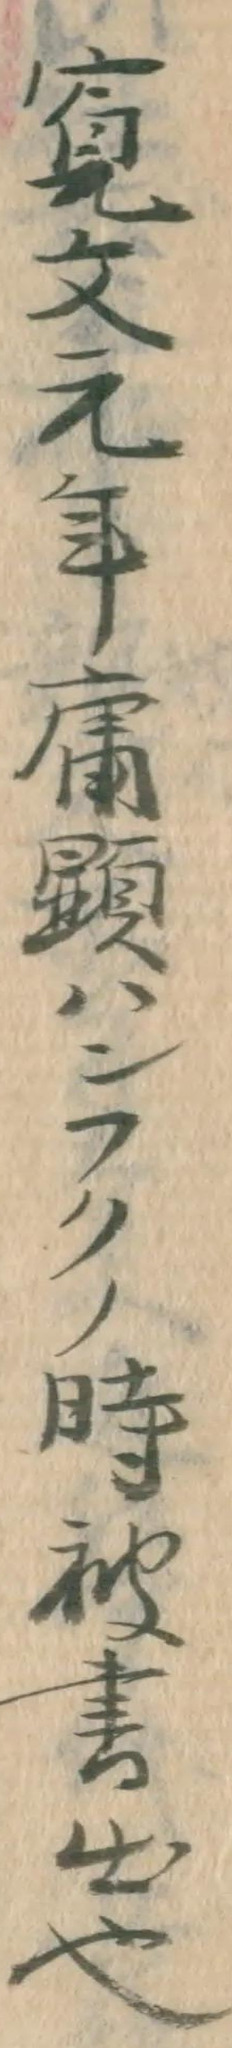寛文元年庸顕ハンフクノ時被書出也
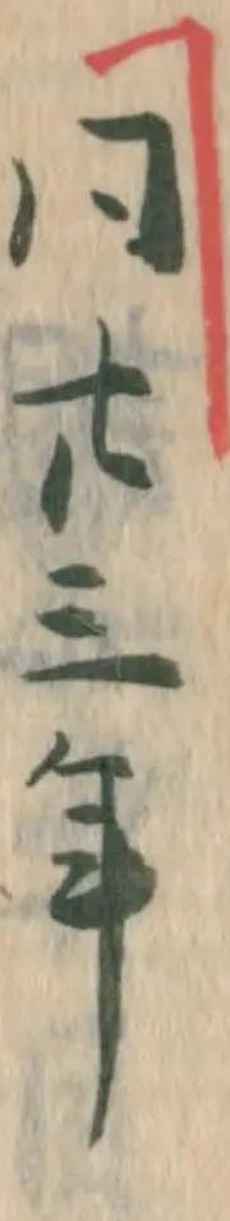同廿三年
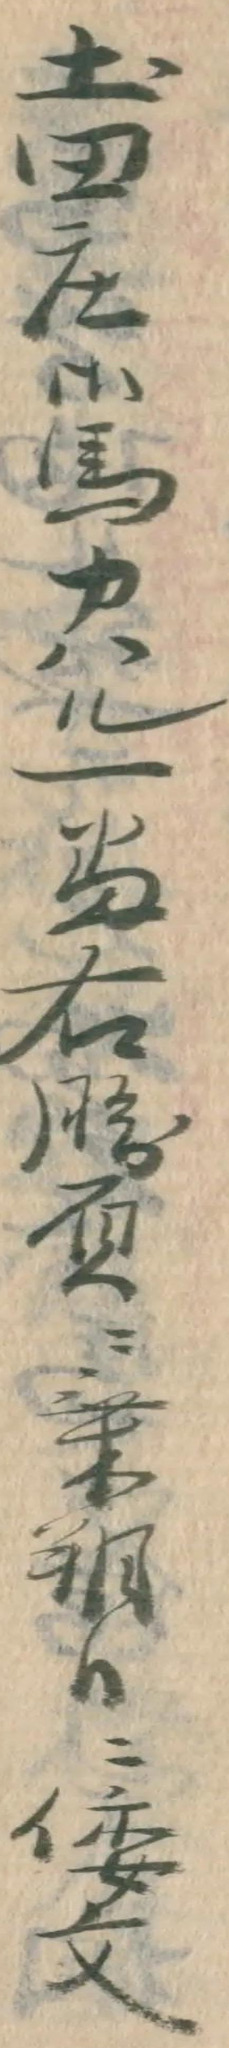土田庄御馬カハル一番右勝負ニ乗朔日ニ倭文
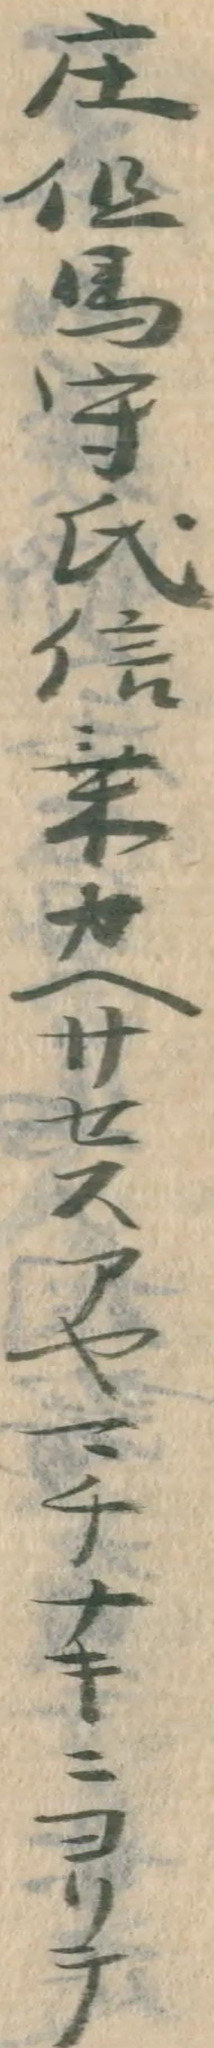庄但馬守氏信乗カヘサセスアヤマチナキニヨリテ
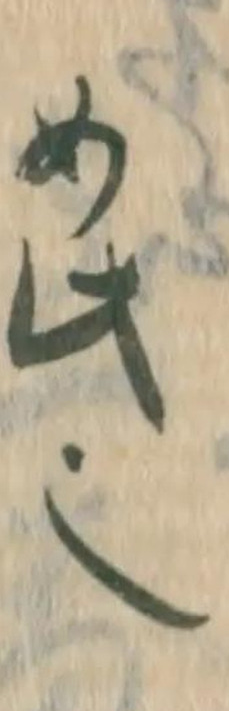如此也
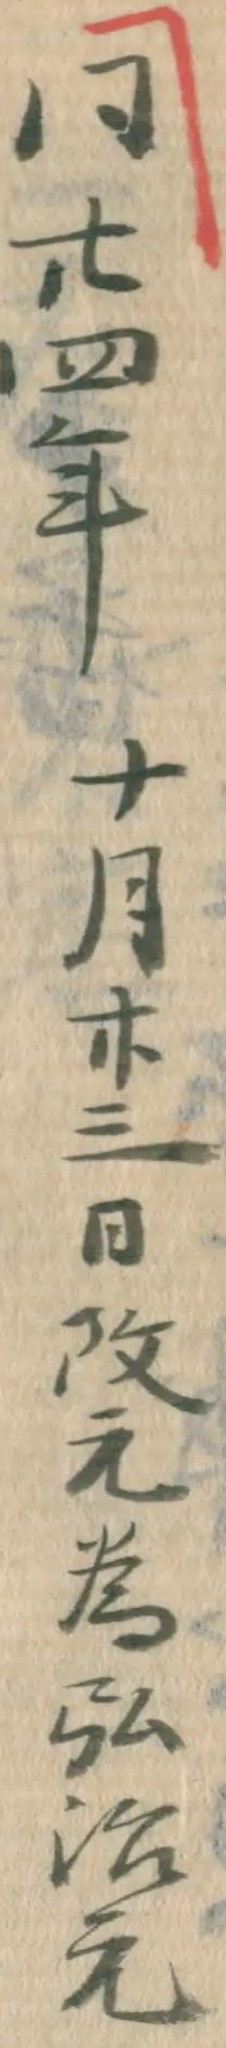同廿四年十月廿三日改元為弘治元
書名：賀茂社記録. 第10冊
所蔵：国立国会図書館 National Diet Library, JAPAN
